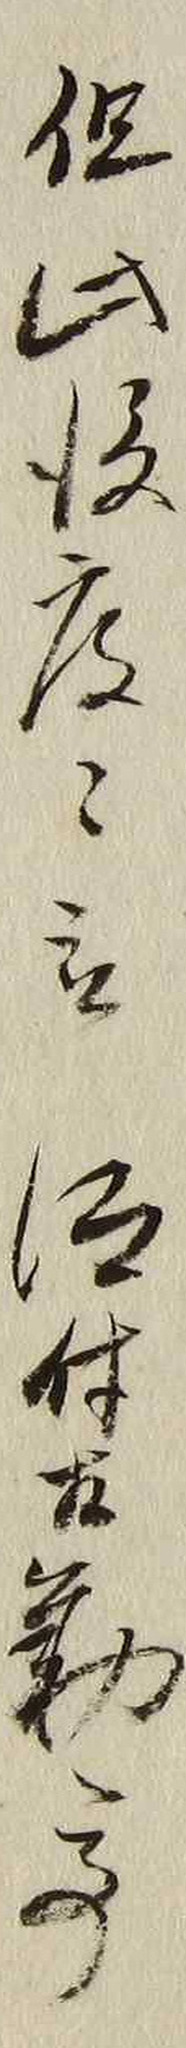但此後度々被仰付相勤候事
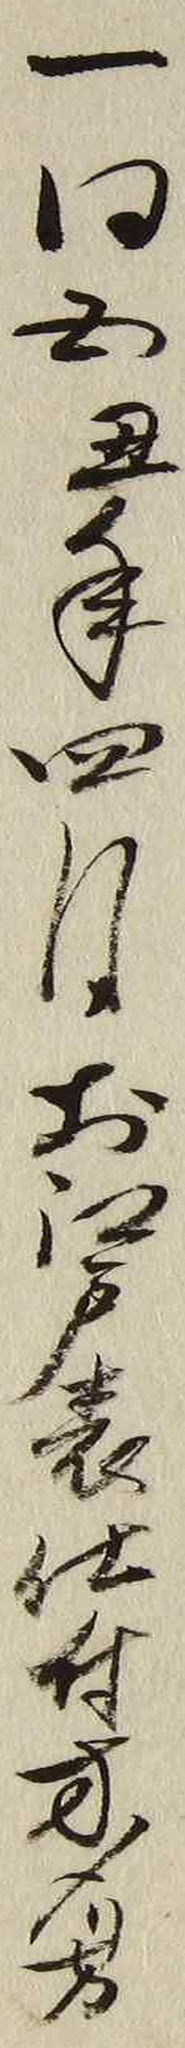一同五丑年四月於江戸表仕付方〆り方
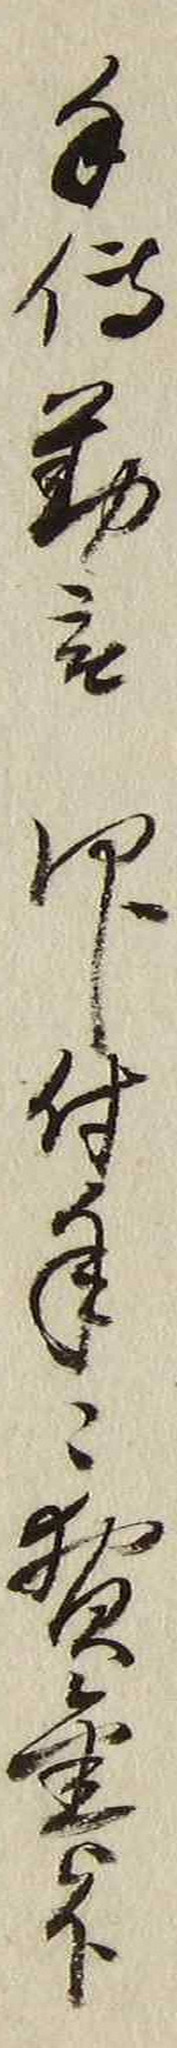手伝勤被仰付年々費金被下
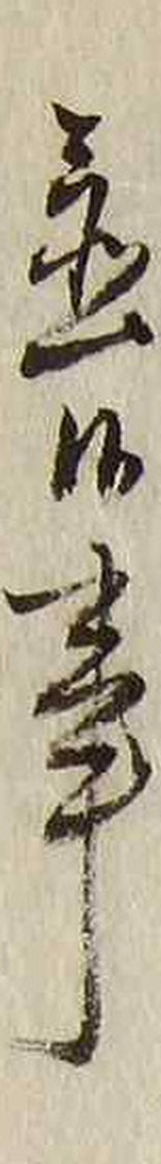置候事

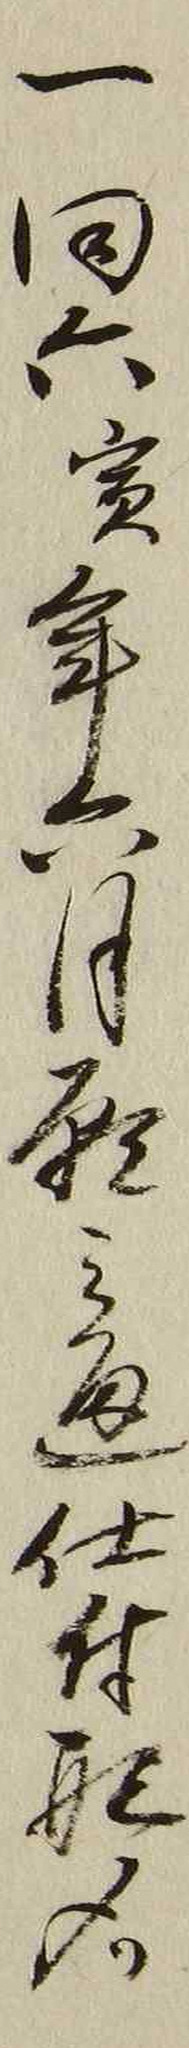一同六寅年六月願之通仕付形〆り
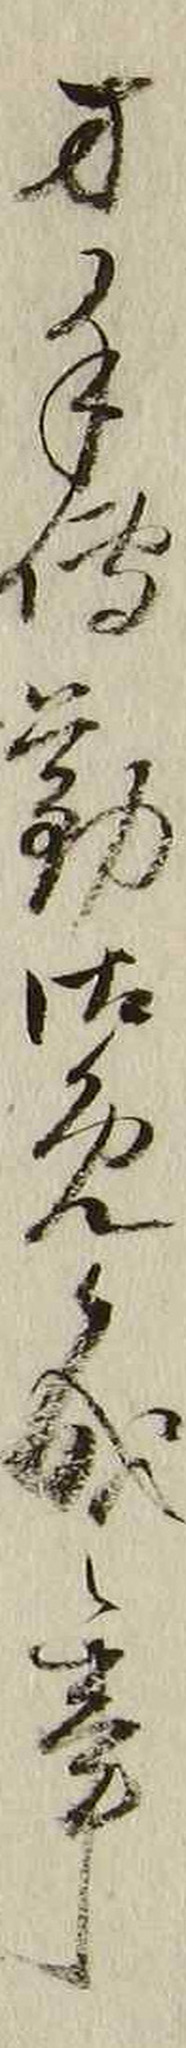方手伝勤御免被成候事
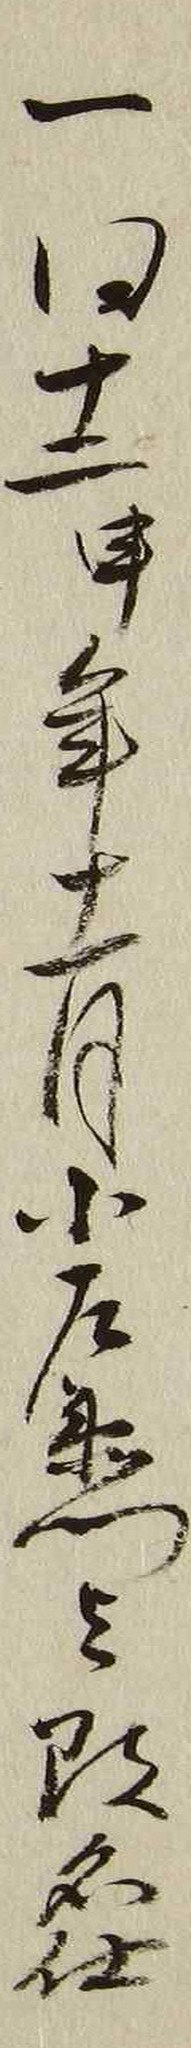一同十二申年十一月小左衛門与改名仕
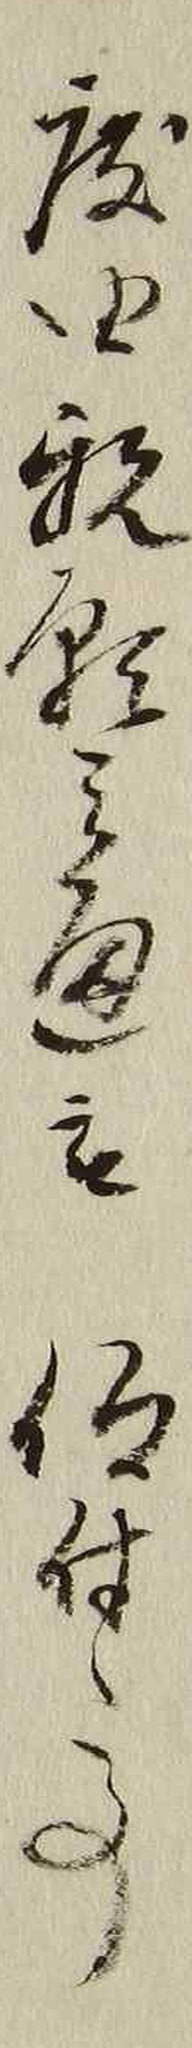度由親願之通被仰付候事
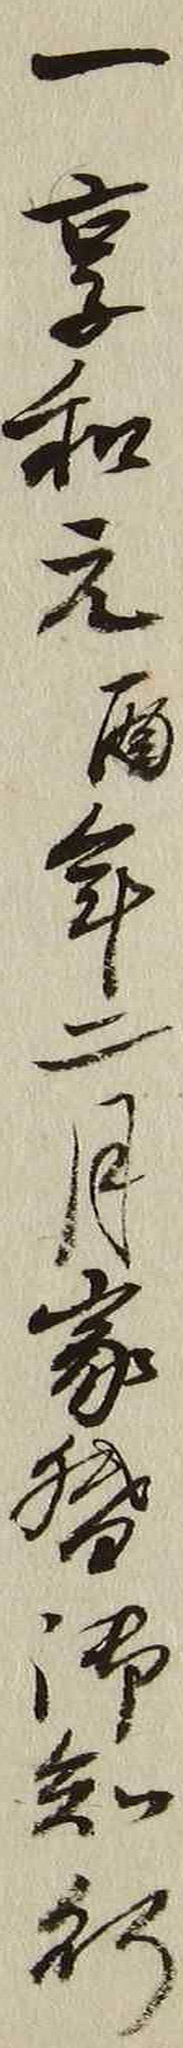一享和元酉年二月家督御知行
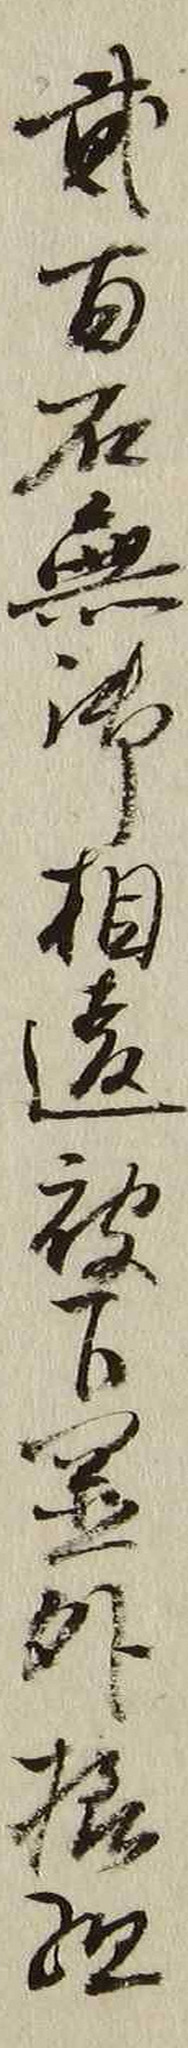弐百石無御相違被下置外様組
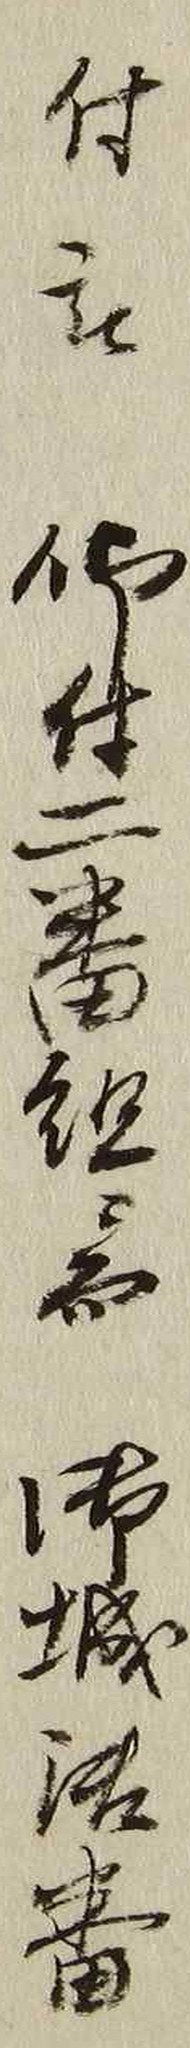付被仰付二番組ニ而御城御番
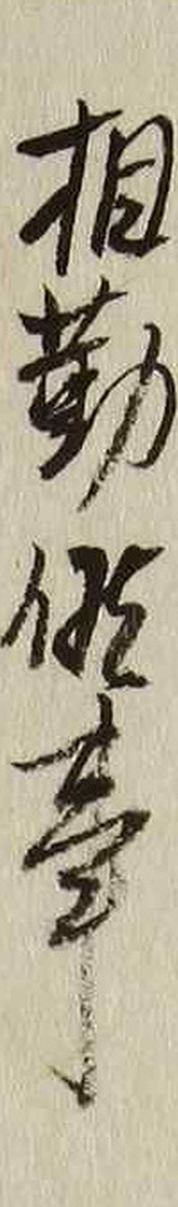相勤候事
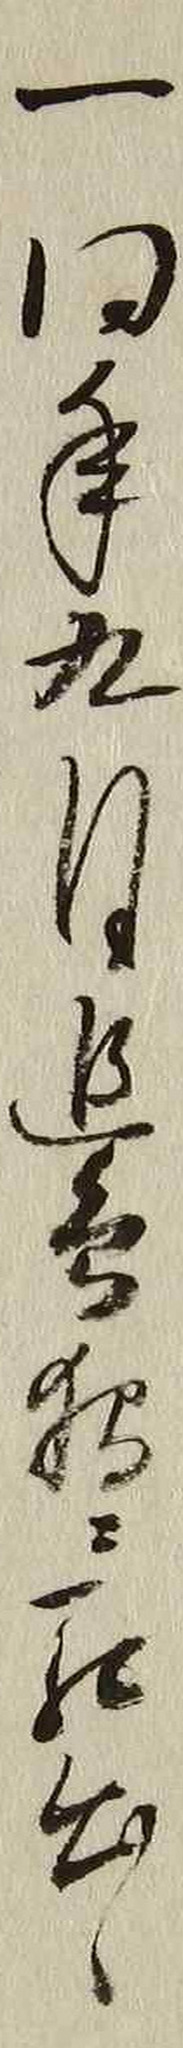一同年九月追鳥狩ニ罷出候
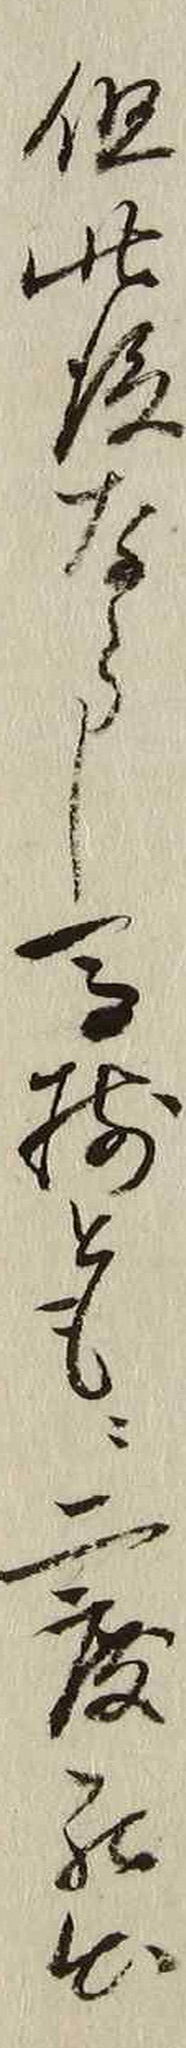但此後ならし馬揃ともニ二度罷出
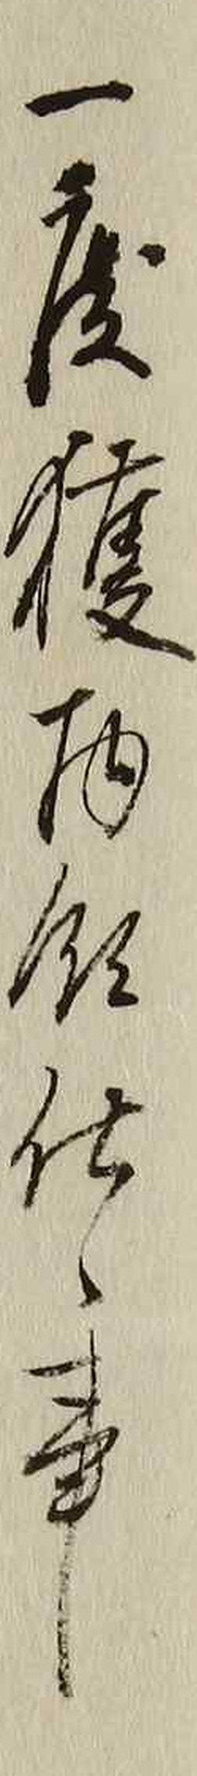一度獲拝領仕候事
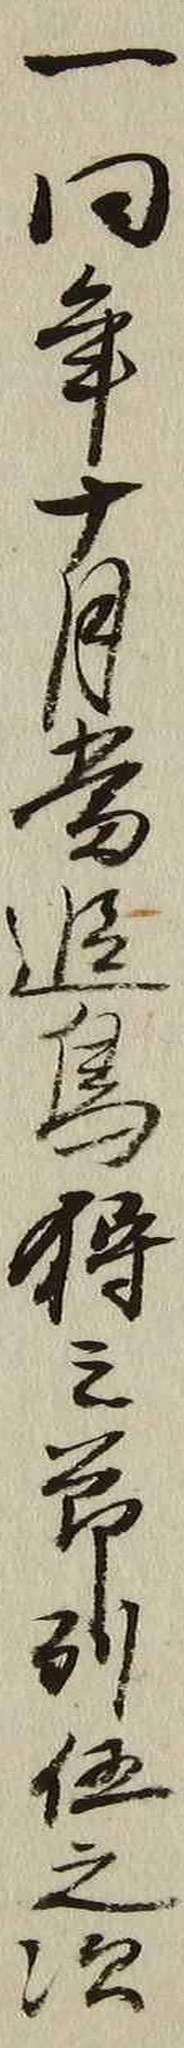一同年十月当追鳥狩之節列伍之次
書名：諸士系譜　巻之352　す之部2
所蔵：会津若松市立会津図書館
